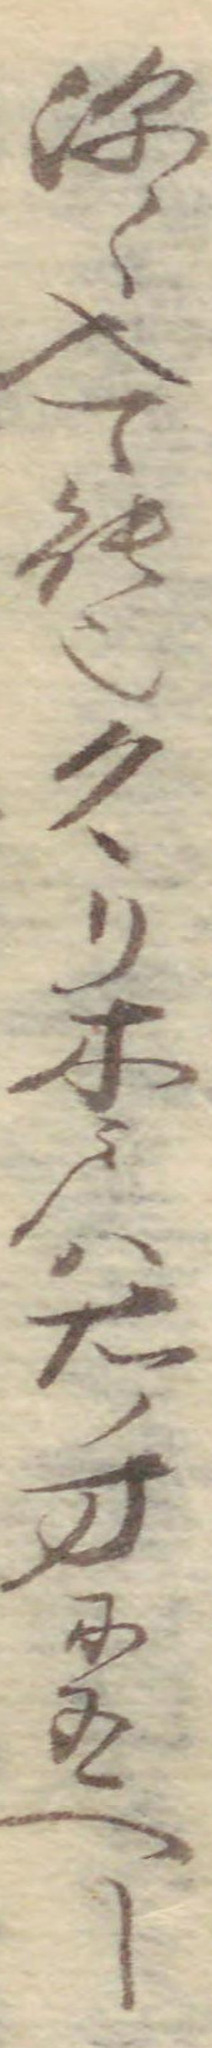深く入て能也クヽリ木戸ハ右ノ方に有へし
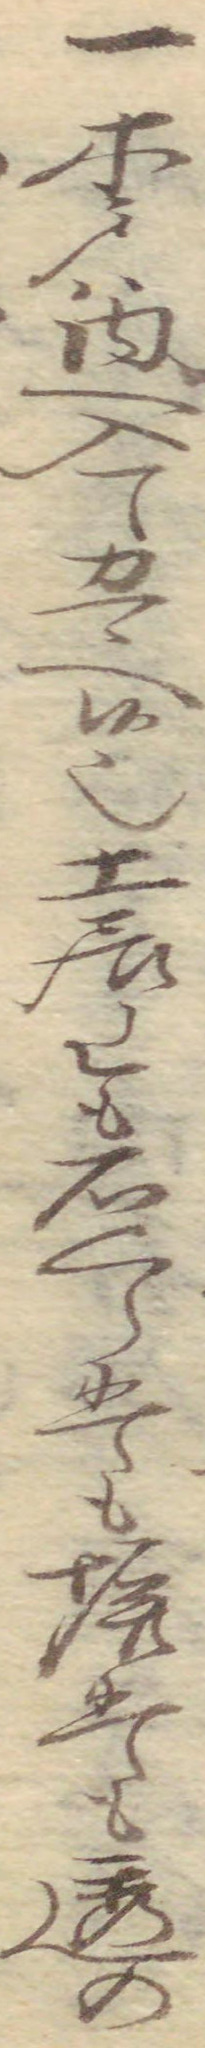一木戸ハ内へ入てカマへ候也土居二ても石くらにても塀にても透の
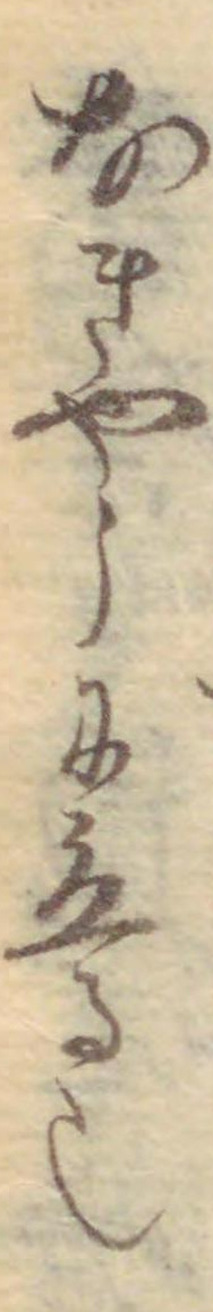なきやうに立る也

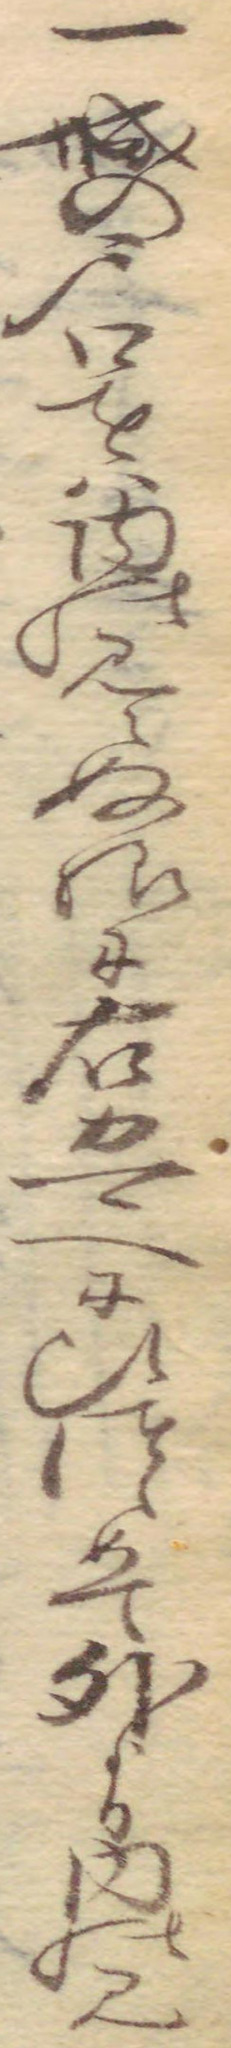一城の戸口をハ内の見えぬ様に右カマヘにひつゝめて外より内の見
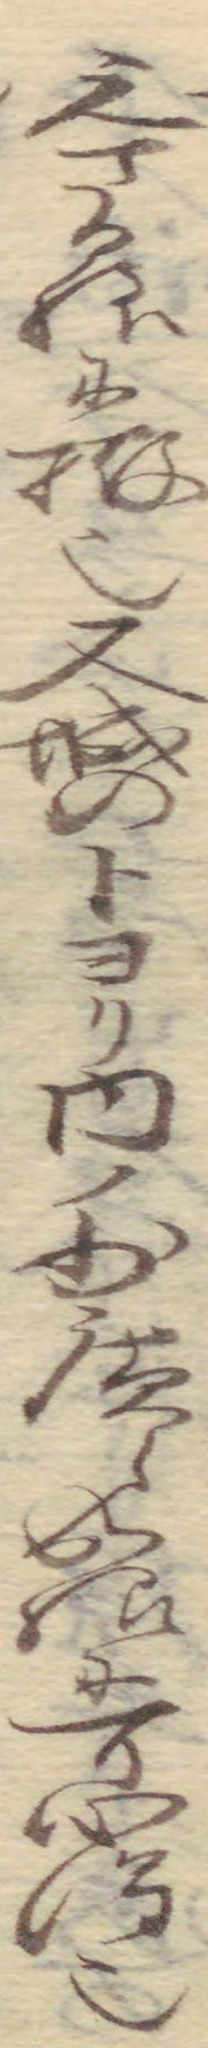えさる様に拵也又城のトヨリ内ノ少広く成様に可心得也
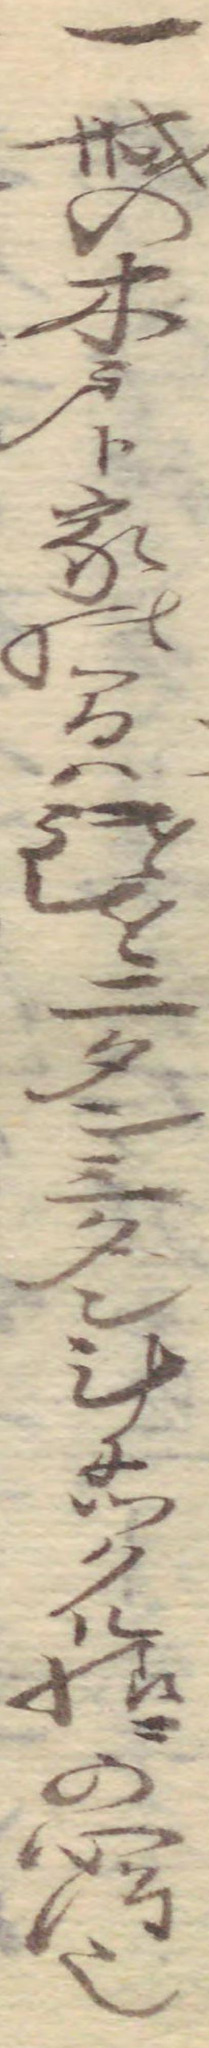一城の木戸ト家の間ハ鑓を二タン三タン斗にツクル様ニ可心得也
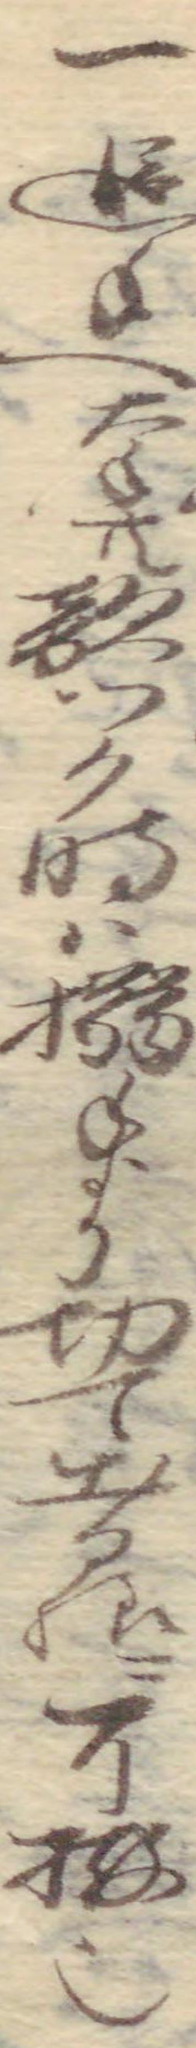一追手へ大手共敵ツク時ハ搦手より切て出る様ニ可拵也
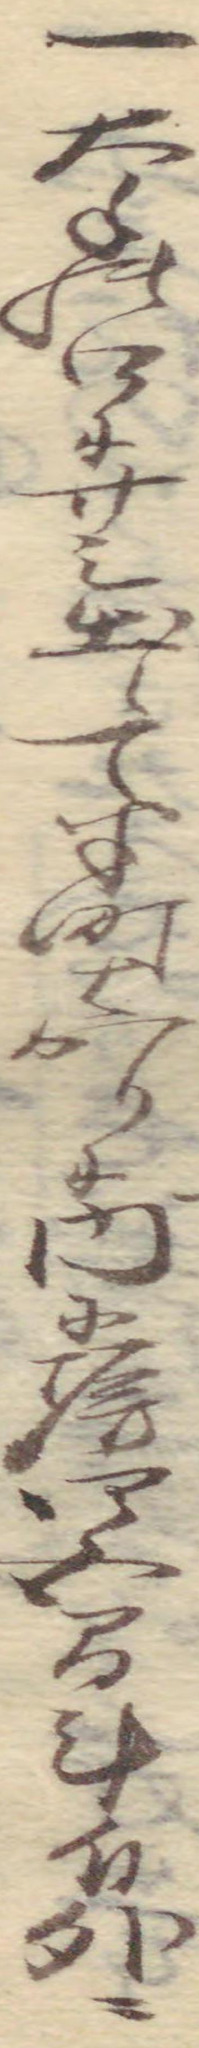一大手の口にサシ出候て半町はかりに内に塀四五間斗付外ニ
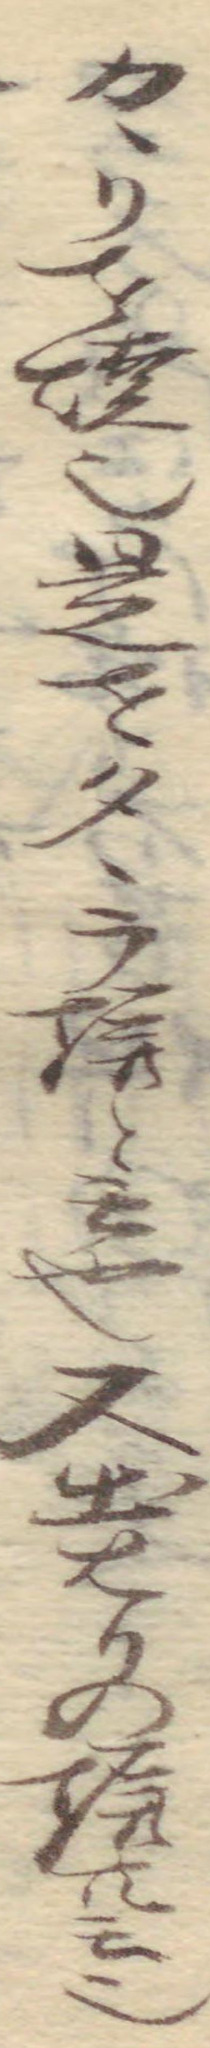カヽリを焼也是をタヽラ塀と云也又出はりの塀共云也
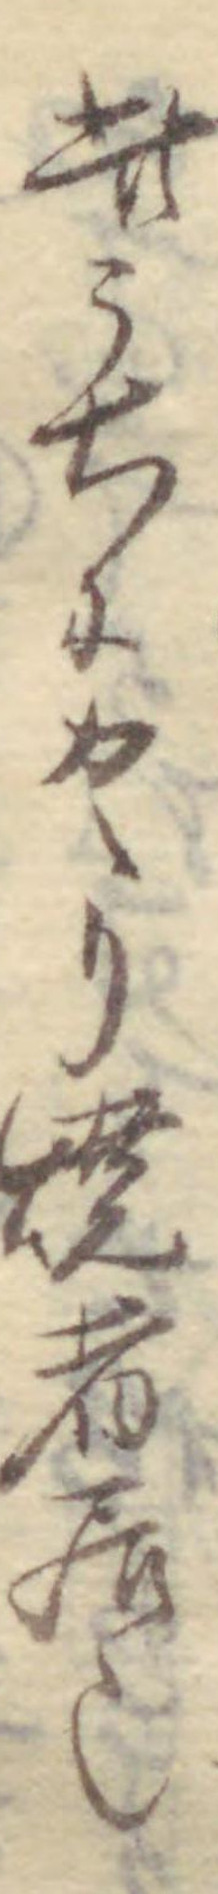此うちにカヽリ焼者居也
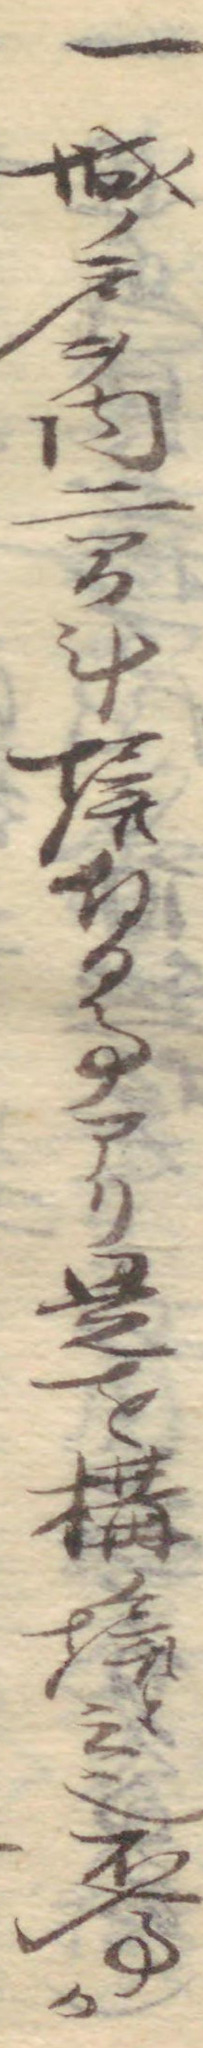一城ノ戸ヲ内二間斗塀付る事アリ是を構塀と云也不入事か
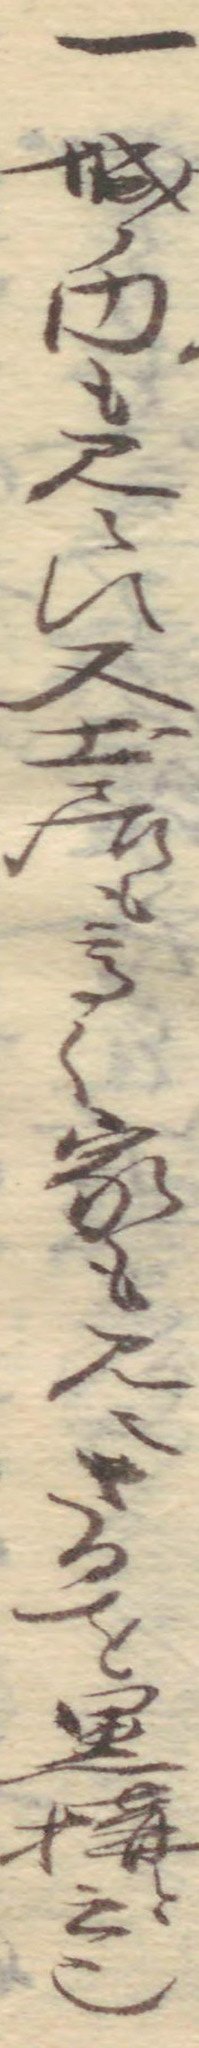一城ノ内も見えす又土居も高く家も見えさるを黒構と云也
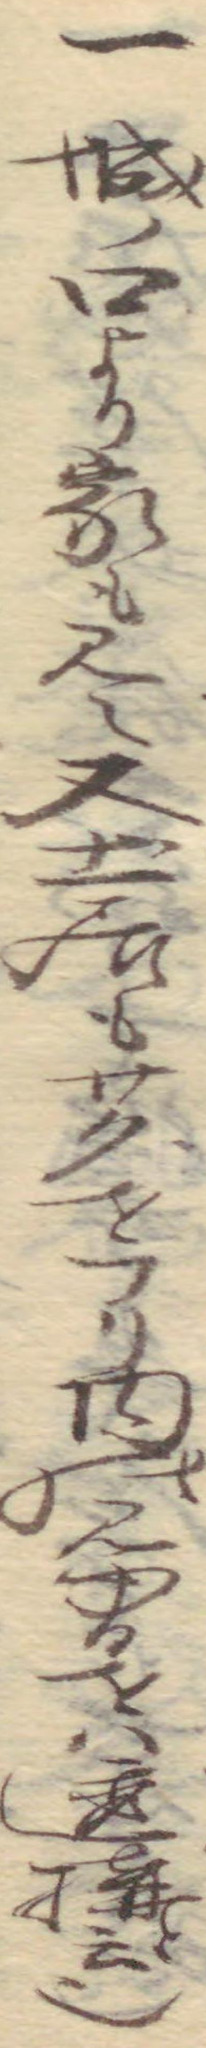一城ノ口より家も見え又土居もサクをフリ内の見ゆるをハ透構と云也
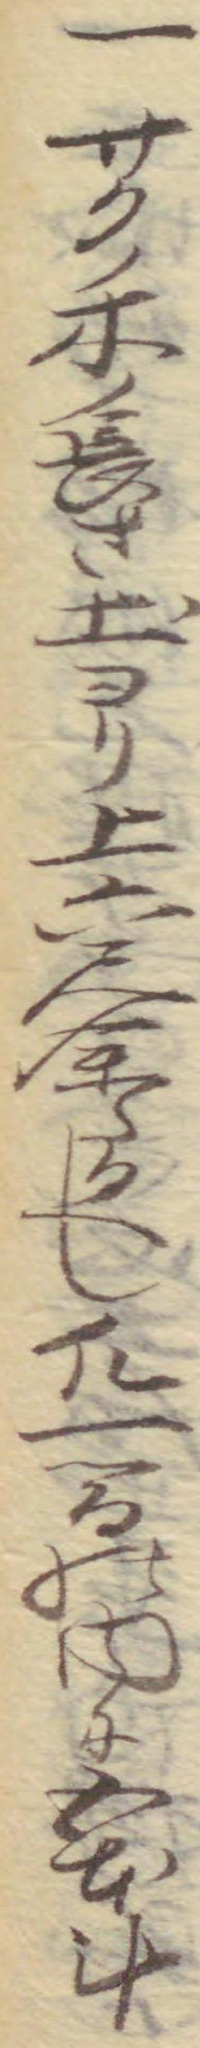一サクノ木ノ長さ土ヨリ上六尺余たるへし凡一間の内に五本斗
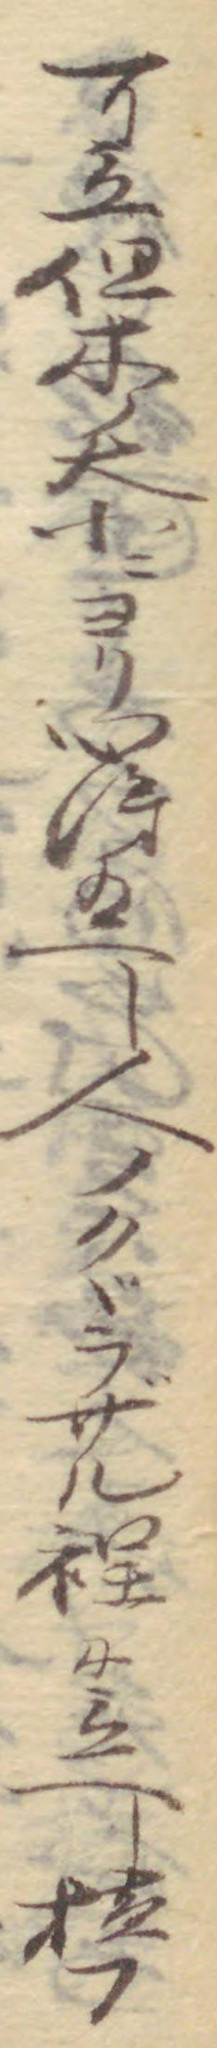可立但木ノ大小ニヨリ心得有へし人ノクヾラザル程に立へし横フ
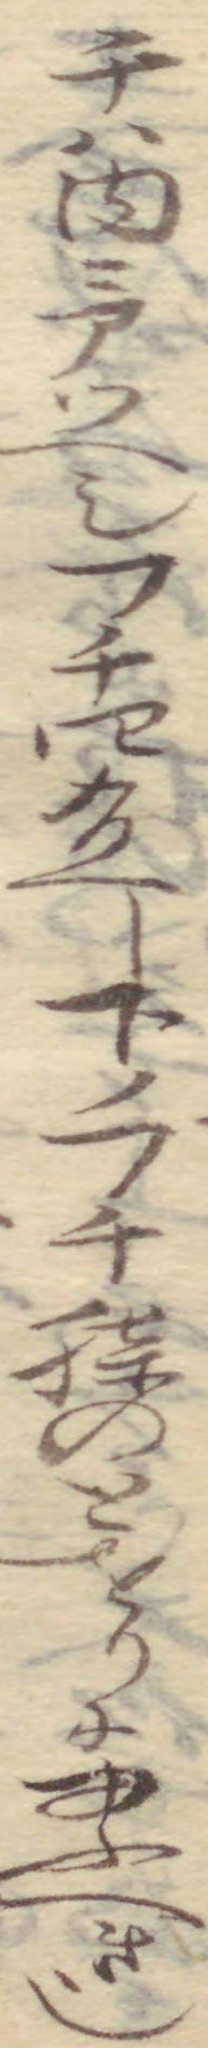チハ内ニアツヘシフチ四有へし下ノフチ膝のとをりにゆふへき也
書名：鶯宿雑記. 巻199-200
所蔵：国立国会図書館 National Diet Library, JAPAN
